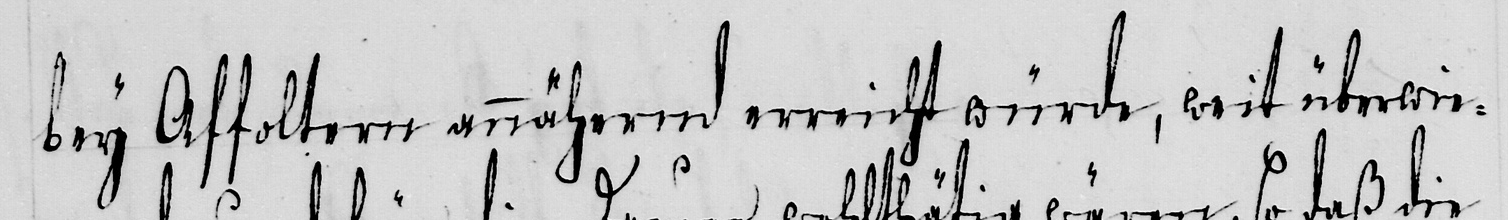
bey Affoltern annähernd erreicht würde, weit überwie¬
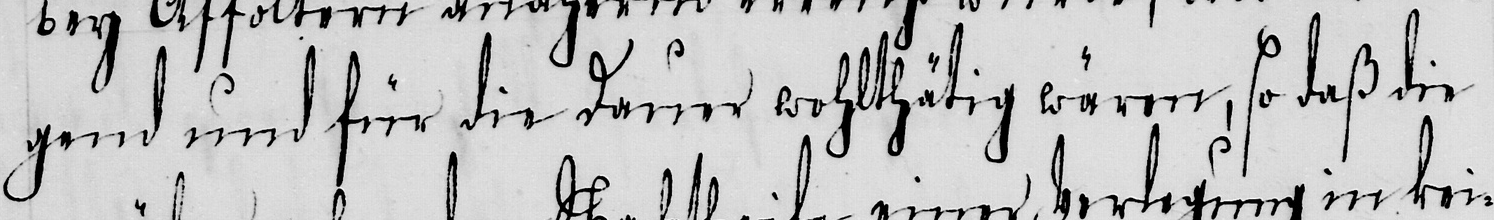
gend und für die Dauer wohlthätig wären, so daß die
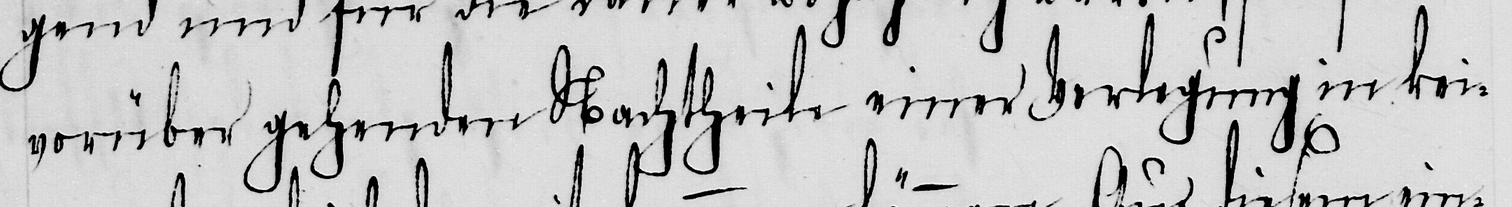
vorüber gehenden Nachtheile einer Verlegung in kei¬
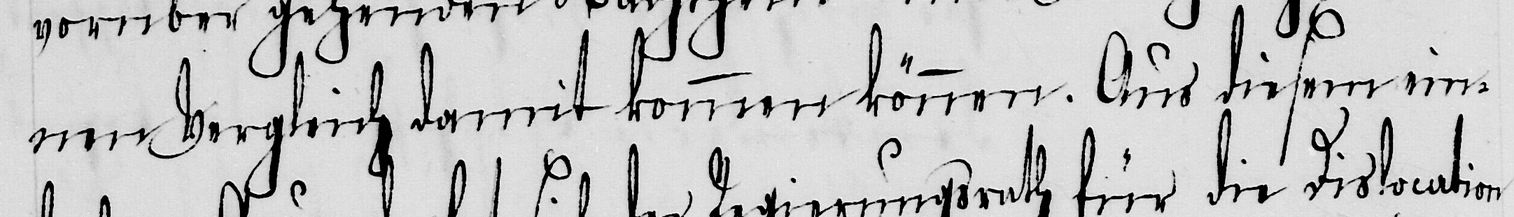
nen Vergleich damit kommen können. Aus diesem ein¬
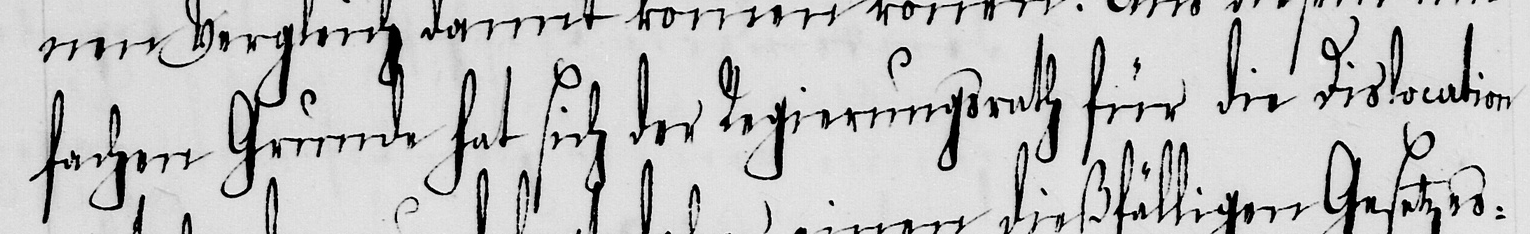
fachen Grunde hat sich der Regierungsrath für die Dislocati¬
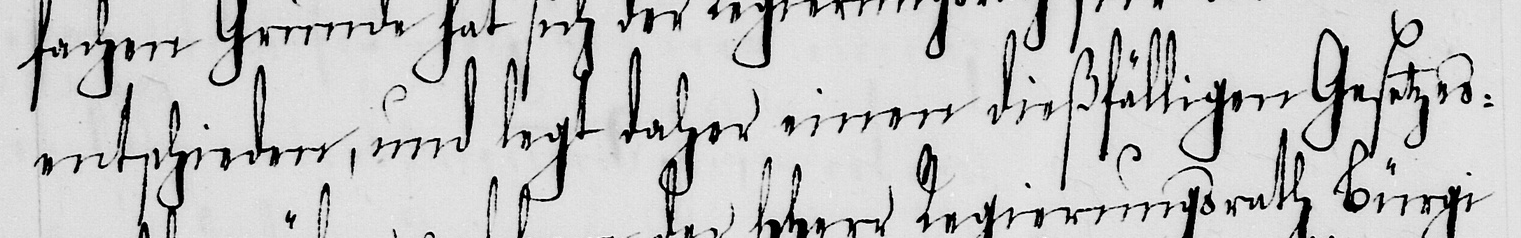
entschieden, und legt daher einen dießfälligen Gesetze¬
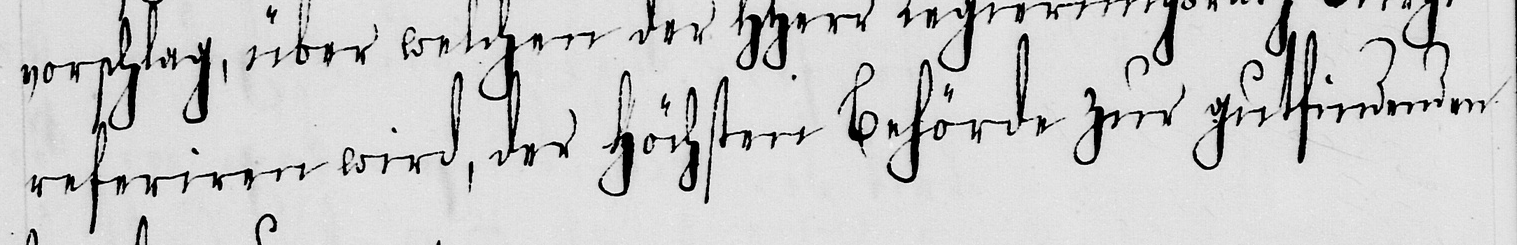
referiren wird, der Höchsten Behörde zur gutfindenden
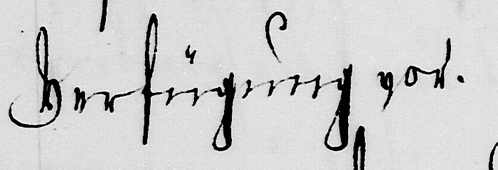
Verfügung vor.
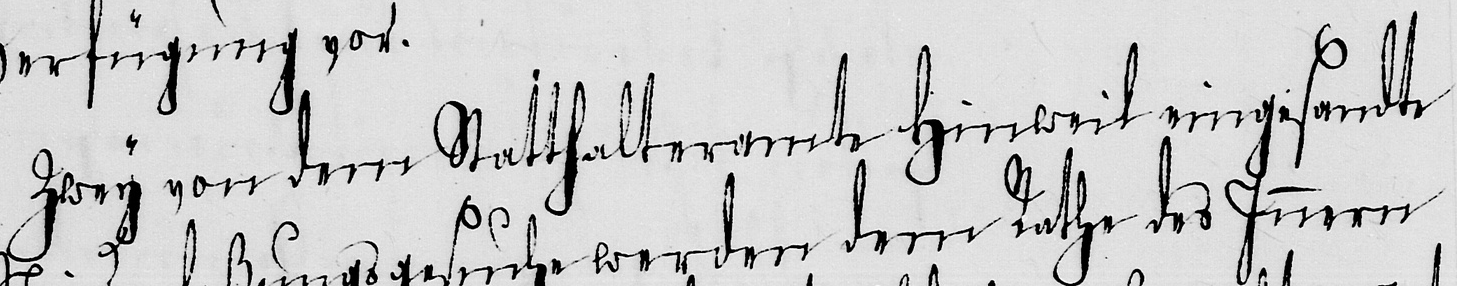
Zwey von dem Statthalteramte Hinweil eingesandte
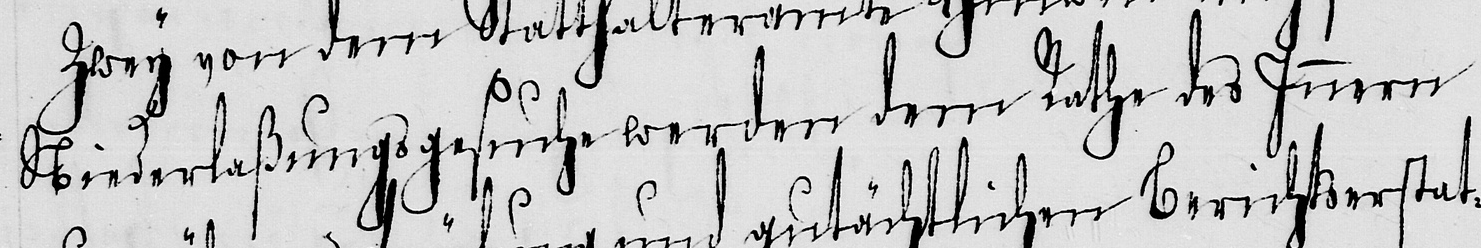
Niederlaßungsgesuche werden dem Rathe des Innern
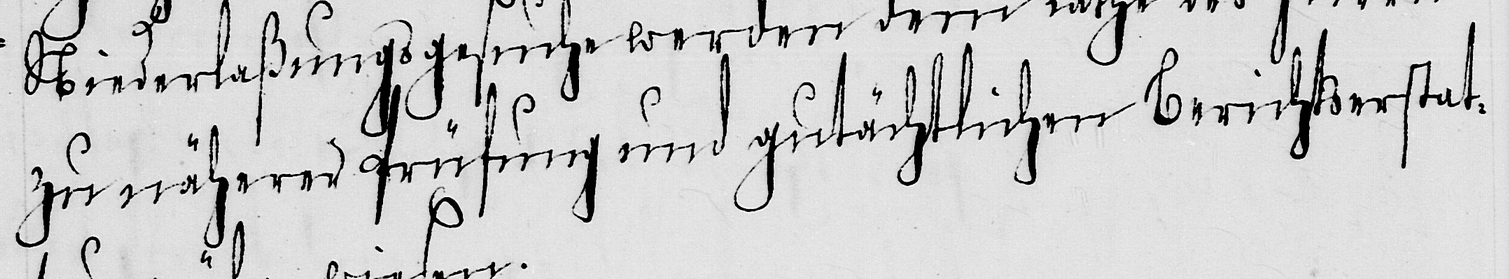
zu näherer Prüfung und gutächtlichen Berichterstat¬
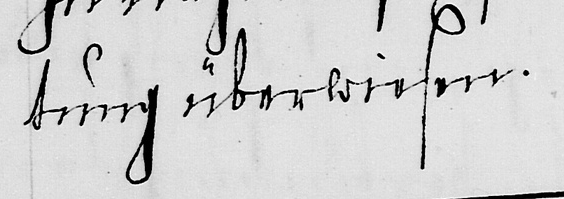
tung überwiesen.
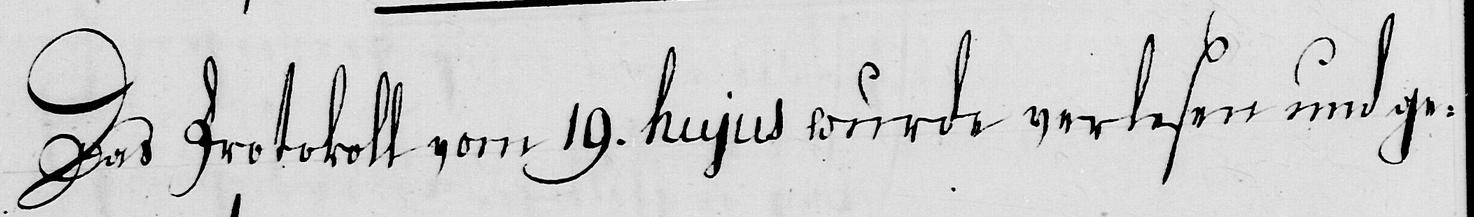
Das Protokoll vom 19. hujus wurde verlesen und ge¬
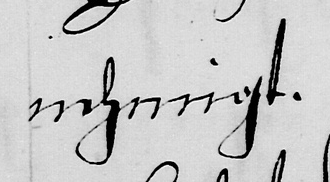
nehmigt.
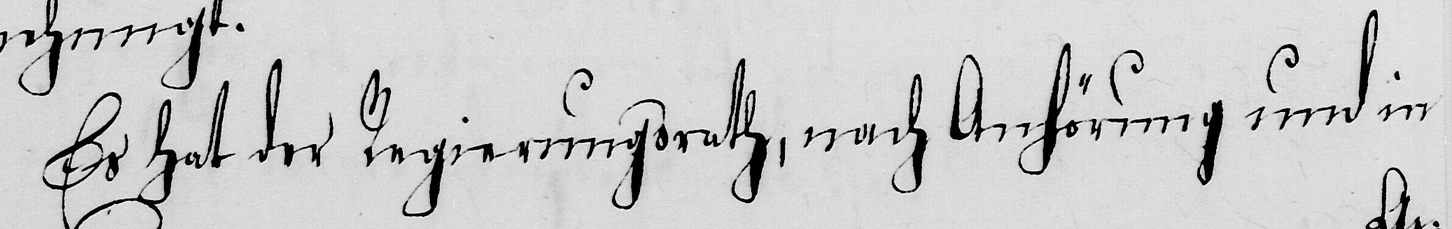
Es hat der Regierungsrath, nach Anhörung und in
